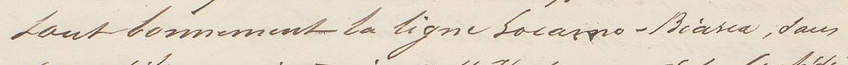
sont bonnement la ligne Locarno–Biasca, sans
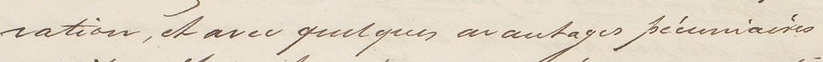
ration, et avec quelques avantages pécuniaires
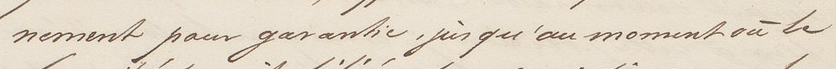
nement pour garantie, jusqu'au moment où le
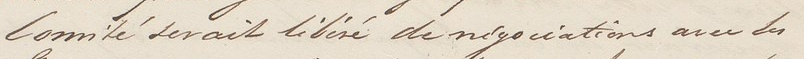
Comité serait libéré de négociations avec les
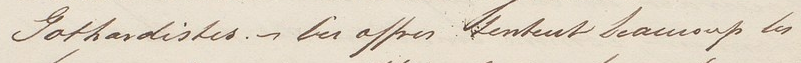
Gothardistes. – Les offres tentent beaucoup les
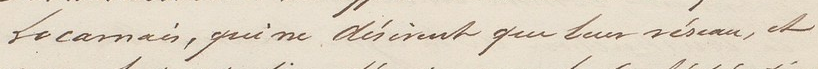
Locarnais, qui ne désirent que leur réseau, et
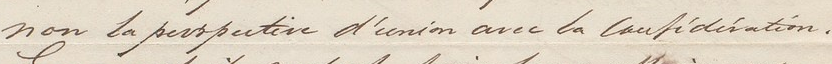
non la perspective d'union avec la Confédération.
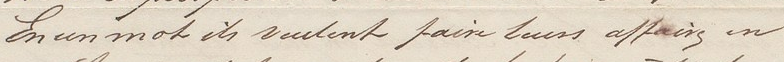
En un mot ils veulent faire leurs affaires en
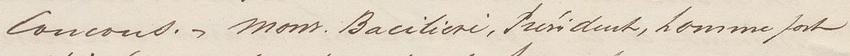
Concours. – Mons. Bacilieri, Président, homme fort
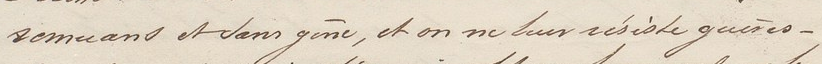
remuans et sans gêne, et on ne leur résiste guères –
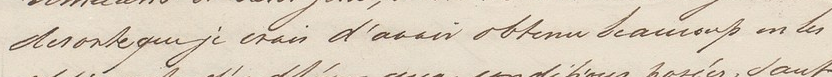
desorte que je crois d'avoir obtenu beaucoup en les
